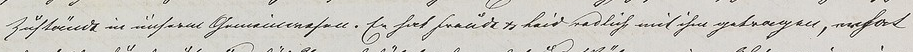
Zustände in unserm Gemeinwesen. Er hat Freude & Leid redlich mit ihm getragen, er hat
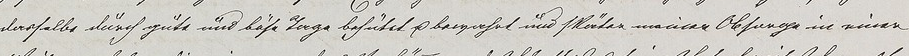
dasselbe durch gute und böse Tage behütet & bewahrt und später meiner Obsorge in einer
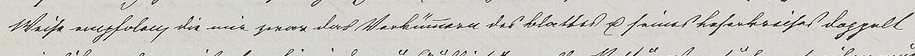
Weise empfolen, die mir zwar das Verkümmern des Blattes & seines Leserkreises doppelt
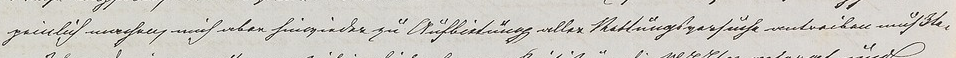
peinlich machen, mich aber hinwieder zu Aufbietung aller Rettungsversuche antreiben mußten.
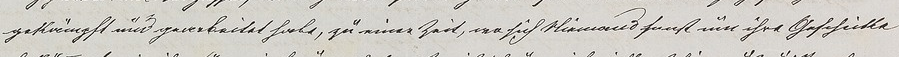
gekämpft und gearbeitet habe, zu einer Zeit, wo sich Niemand sonst um ihre Geschichte
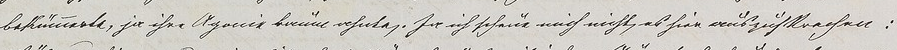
bekümmerte, ja ihre Agonie kaum ahnte. Ja ich schäm mich nicht, es hier auszusprechen:
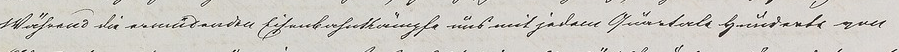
Während die ermüdenden Eisenbahnkämpfe uns mit jedem Quartale Hunderte von
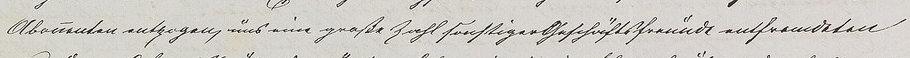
Abonnenten entzogen, uns eine große Zahl sonstiger Geschäftsfreunde entfremdeten
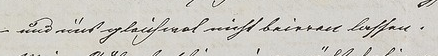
– und uns gleichwol nicht beirren lassen.
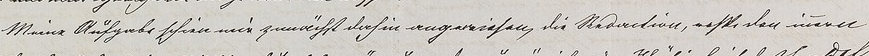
Meine Aufgabe schien mir zunächst dahin angewiesen, die Redaction, resp. den innern
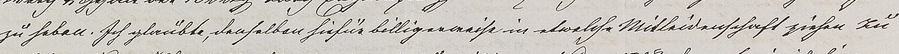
zu heben. Ich glaubte, denselben hiefür billigerweise in etwelche Mitleidenschaft ziehen zu
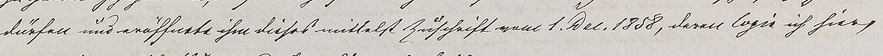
dürfen und eröffnete ihm dieses mittelst Zuschrift vom 1. Dec. 1858, deren Copie ich hier,
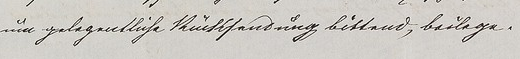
um gelegentliche Rücksendung bittend, beilege.
